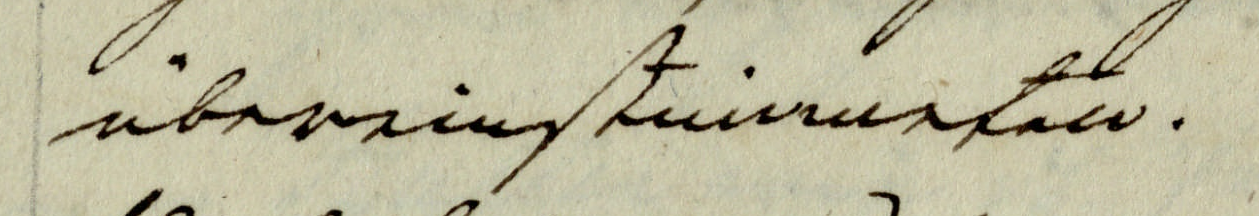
übereinstimmeten.
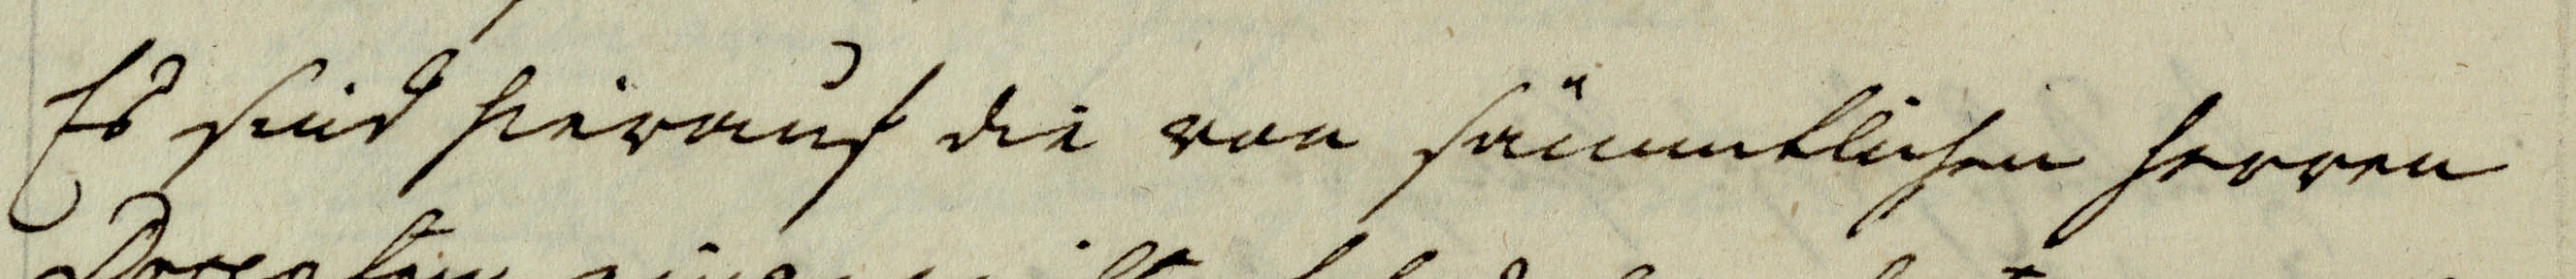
Es sind hierauf die von sämmtlichen Herren
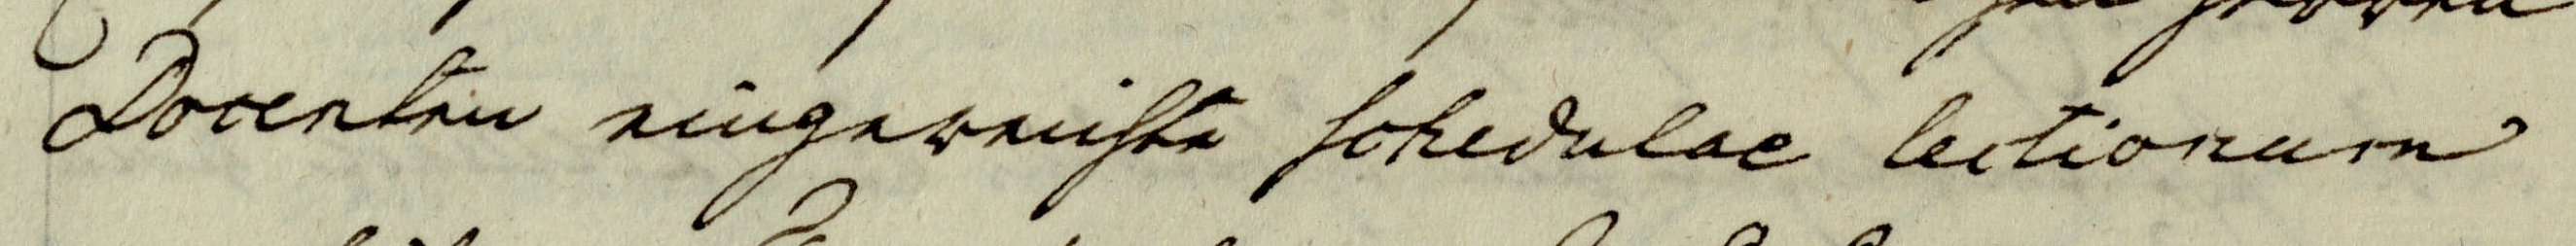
Docenten eingereichte Schedulae lectionum
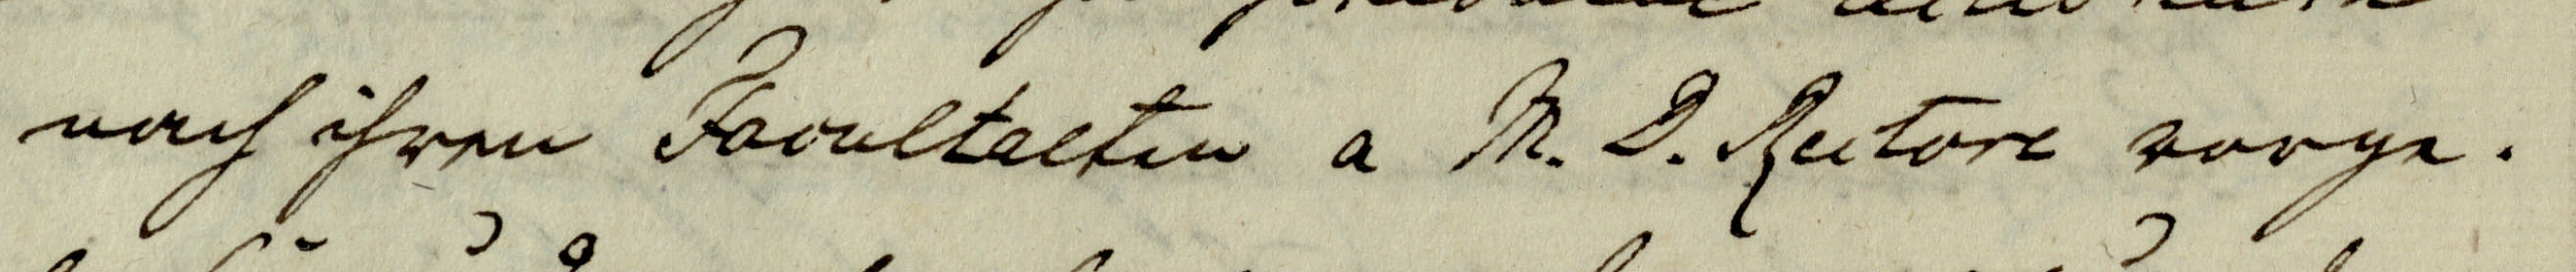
nach ihren Facultaeten a M. D. Rectore vorge¬
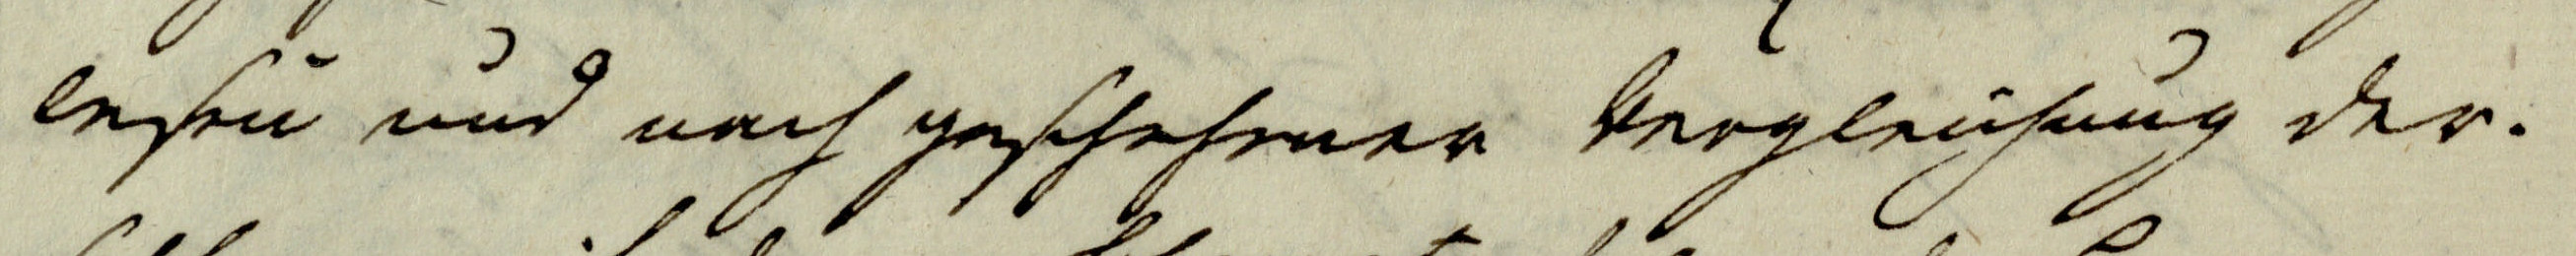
lesen und nach geschehener Vergleichung der¬
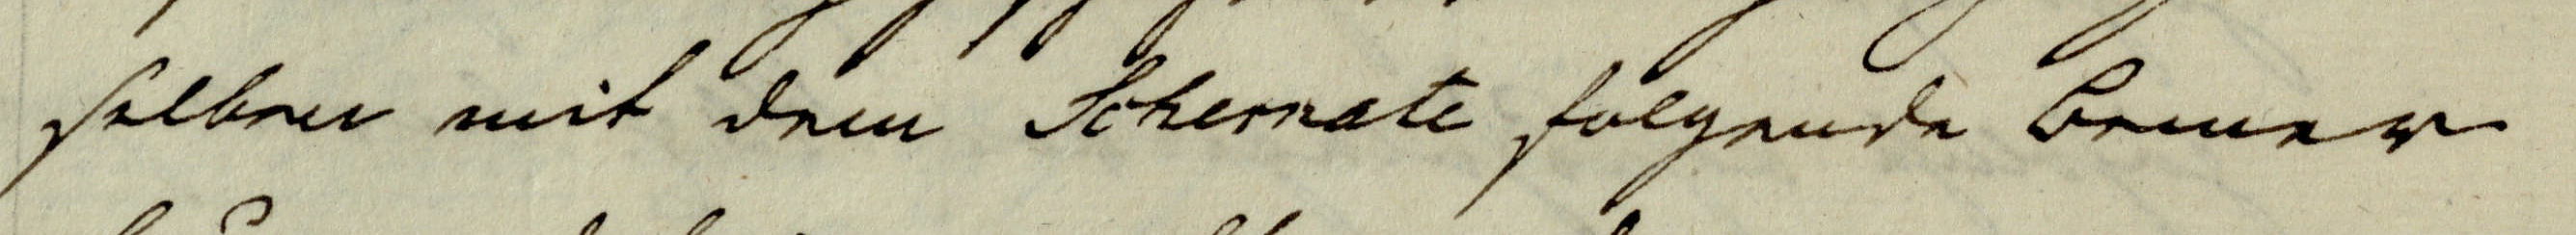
selben mit dem Schemate folgende Bemer
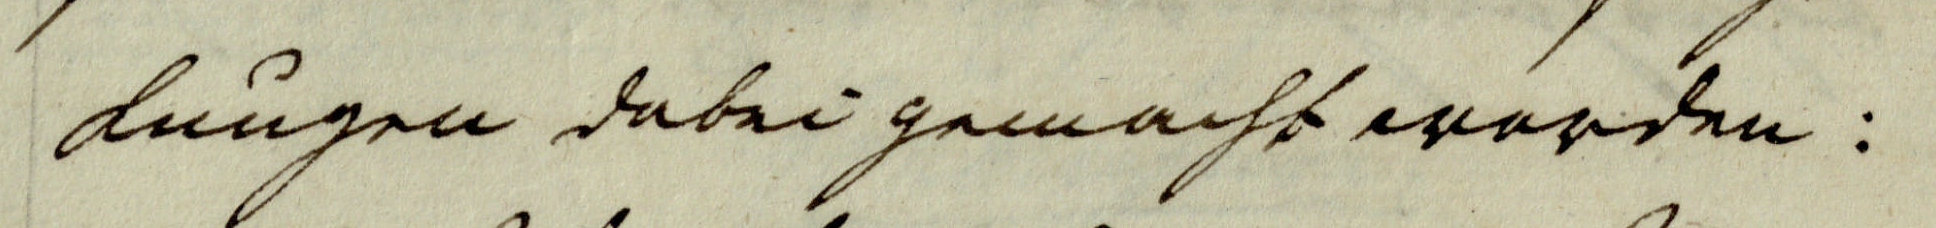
kungen dabei gemacht worden:
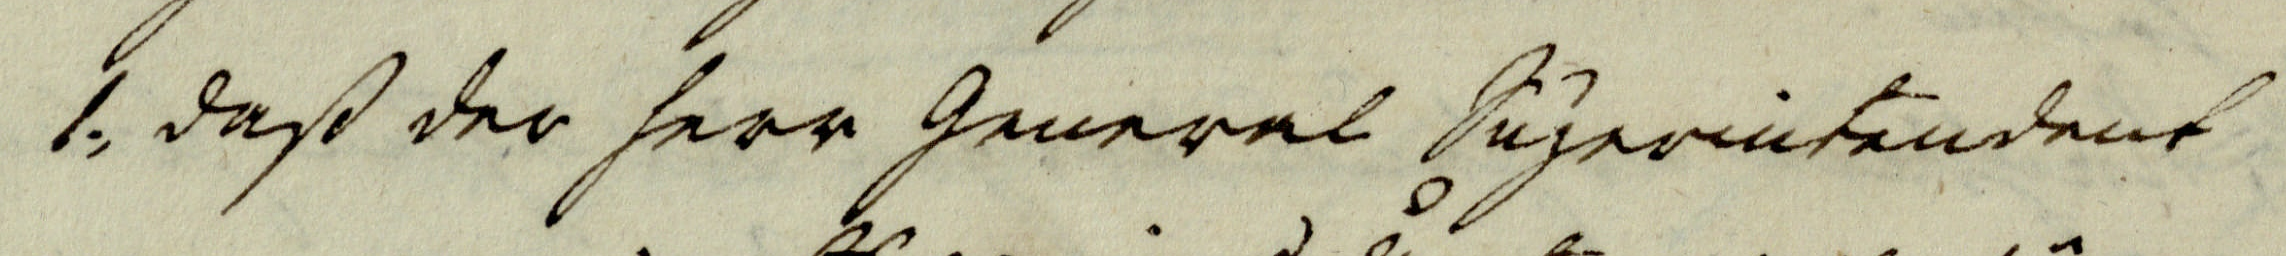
1., daß der Herr General Superintendent
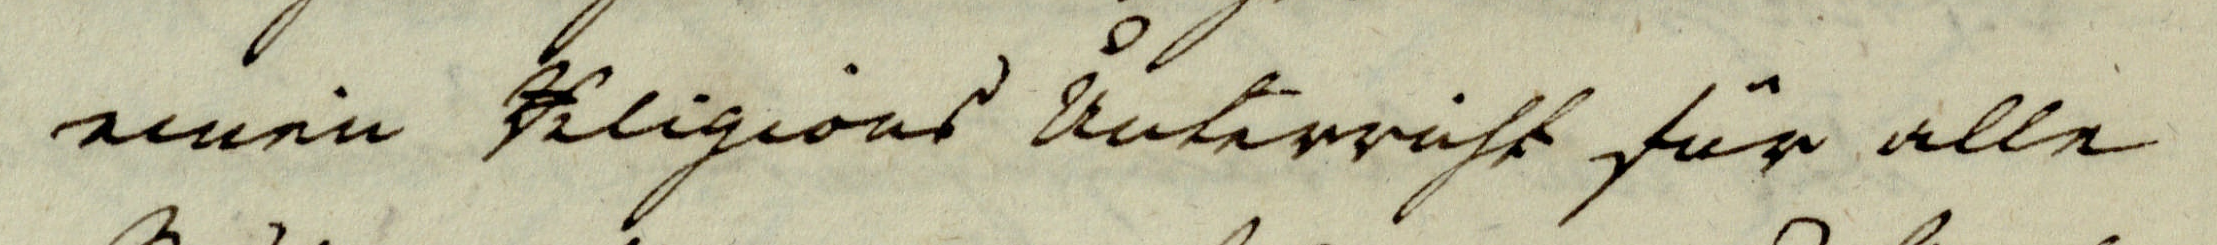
einen Religions Unterricht für alle
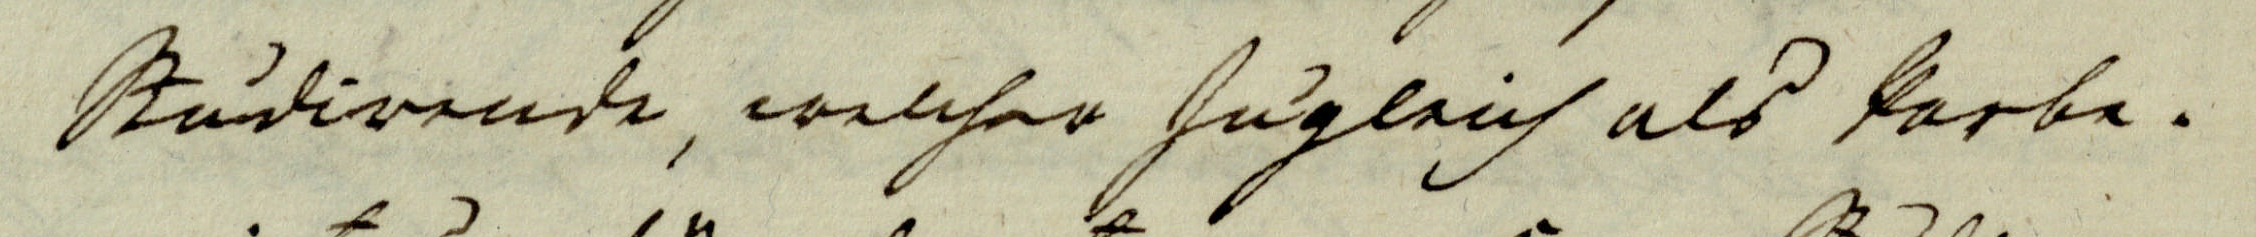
Studirende, welcher zugleich als Vorbe¬
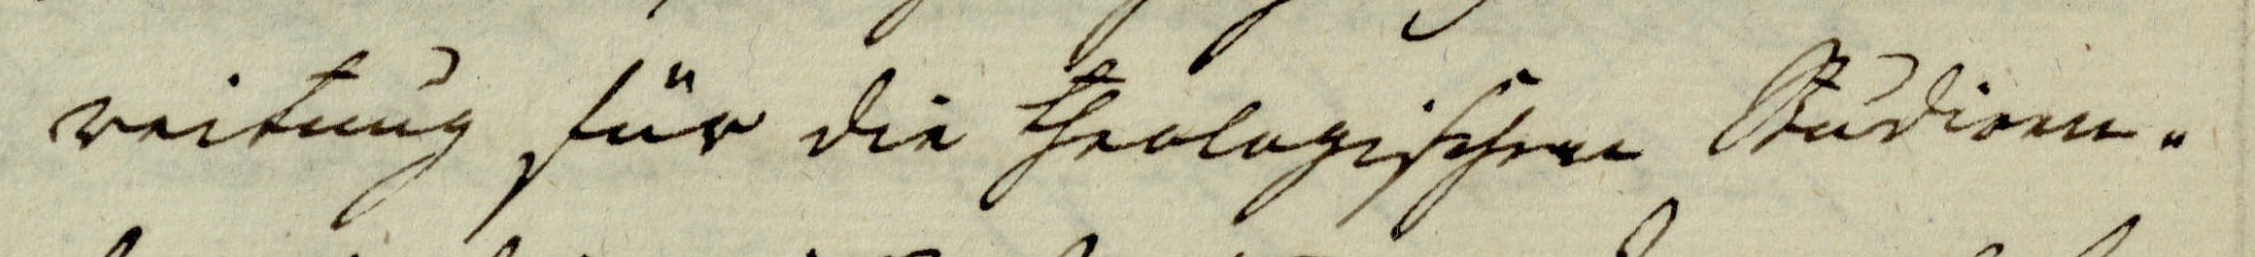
reitung für die theologischen Studiren¬
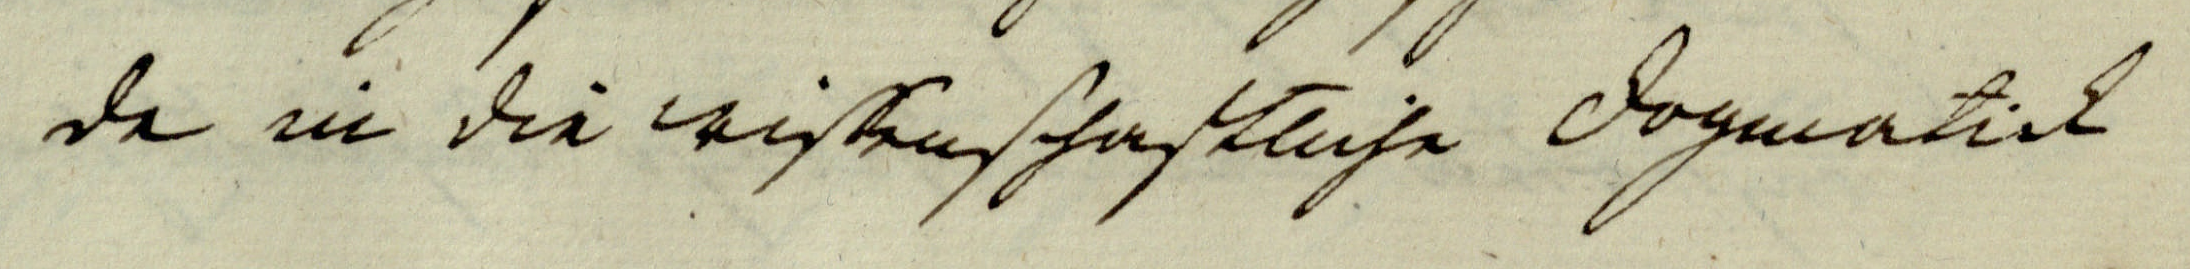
de in die wissenschaftliche Dogmatick
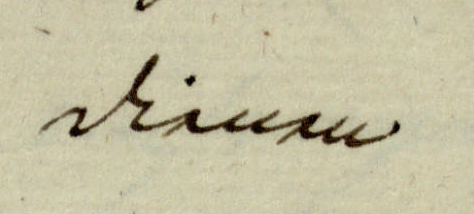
dienen
